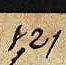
121
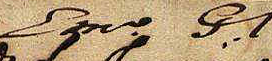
Em.o S.es
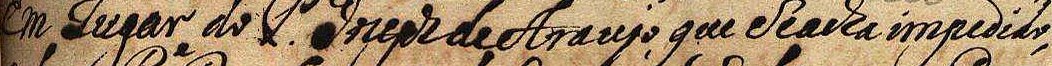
Em Lugar do P.e Iozeph de Araujo, que Se acha impedido,
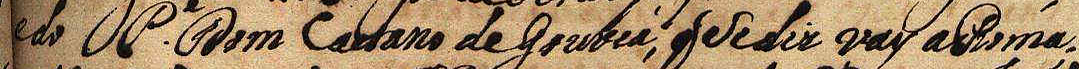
e do P.e Dom Caetano de Gouvea, q̄ se diz vay a Roma,
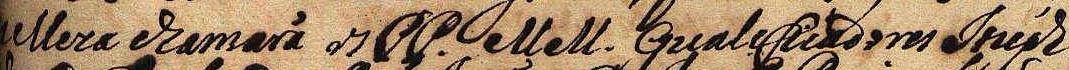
Meza chamará os PP. MM. Qualificadores Iozeph
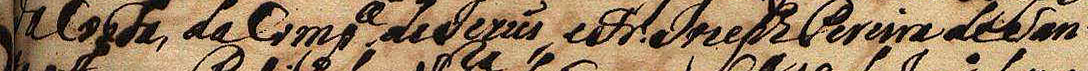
da Costa, da Comp.a de Iezus, e Fr. Iozeph Pereira de San
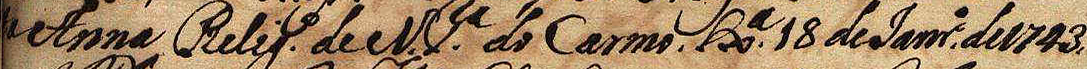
a Anna Relig.o de N. S.ra do Carmo. Lx.a 18 de Ianr.o de 1743.
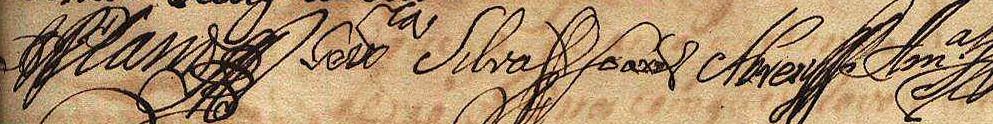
Ro lance Teixra Silva Soares Abreu Ama.l
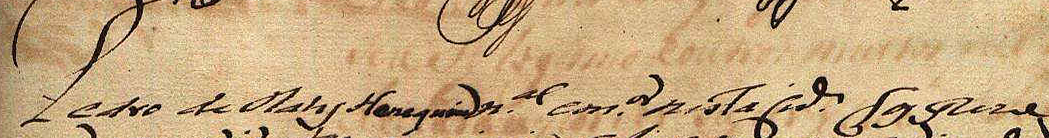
Pedro de Rates Henequī n.al e m.or nesta Cid.e foy prezo
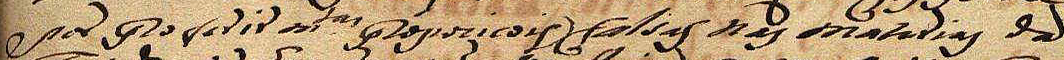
por proferir mtas propoziçois falsas nas materias da
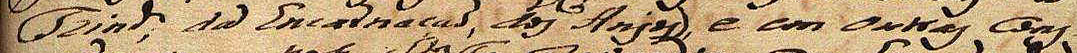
Trind,e da Encarnaçaõ, dos Anjos, e em outras cons
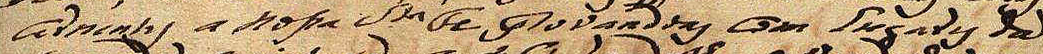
cernentes a nossa Sta Fe provandoas com Lugares da
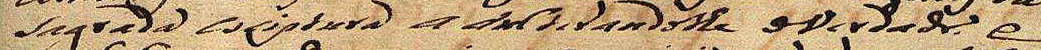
sagrada esciptura a alterandolhe o verdadr.o e
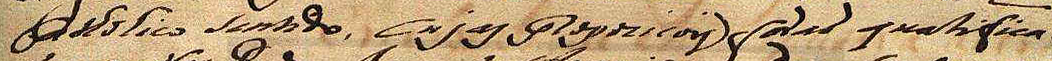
Catholico sentido, cujas propoziçois, foraõ quatifica
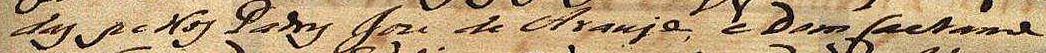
das pellos Padres Joze de Araujo, e Dom Caetano
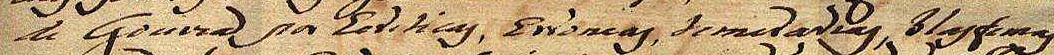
de Gouvea por hereticas, E eroneas, temerarias, blasfemas
